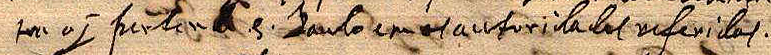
tra o q̄ pertende s. Paulo em as autoridades referidas.
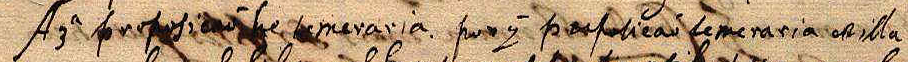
A 3a proposiçaõ he temeraria porq̄ proposiçaõ temeraria est illa
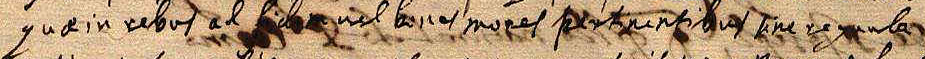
quæ in rebus ad fidem uel bones mores pertinentibus sine reguula
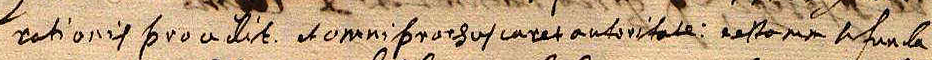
rationis procedit. et omni prorsus caret autoritate: e esta nom se funda
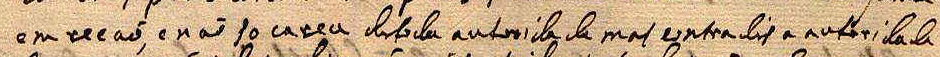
em reçaõ, e naõ so carece de toda autoridade mas contradis a autoridade
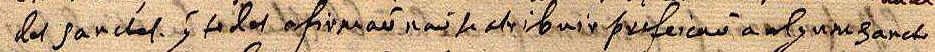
dos sanctos. q̄ todos afirmaõ naõ se atribuir prefeiçaõ a algum sancto
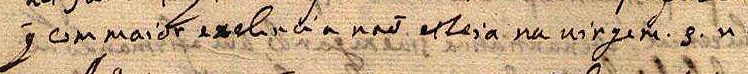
q̄ com maior exelencia naõ esteia na uirgem. s. n.
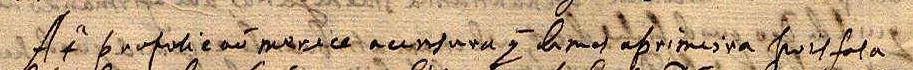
A 4a proposiçaõ merece a censura q̄ demos a primeira pois fas a
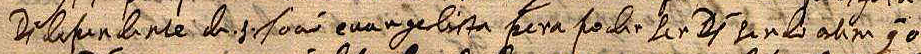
Ds̄ dependente de s. Ioaõ euangelista pera poder ser Ds̄ sendo asim q̄ o
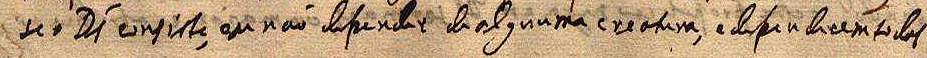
ser Ds̄ consiste, em naõ depender de alguma creatura, e dependerem todas
